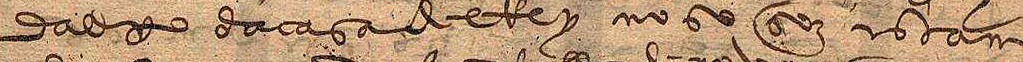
dallgo da casa del Rey noso s̄or estam
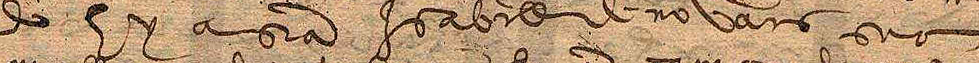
do hy a srā Jsabell de novaes sua
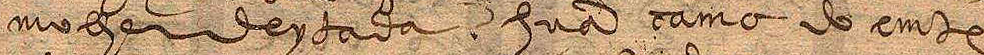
molher deytada ē huā cama doemte
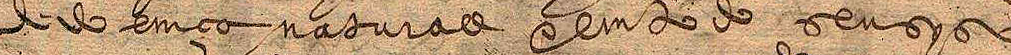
de doemça naturall e em todo seu syso
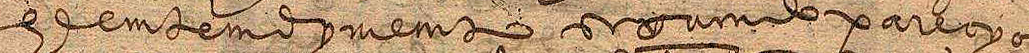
he emtemdymemto segumdo pareçya
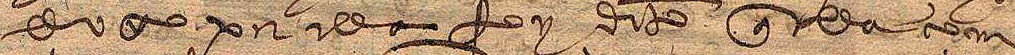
llogo per ella foy dito q̄ ella com
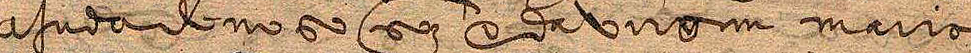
aJuda de noso s̄or e da virgem maria
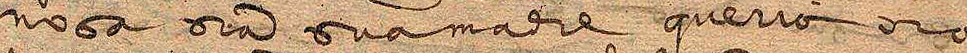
nosa srā sua madre queria ora
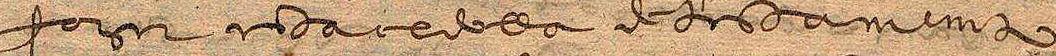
fazer esta cedolla de testamemto
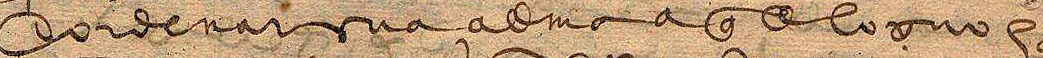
e ordenar sua allma a q̄ll loguo ha
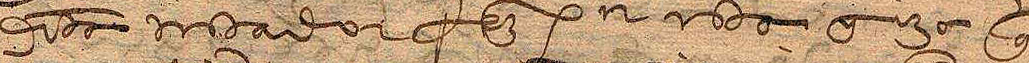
dita testador fez per esta giza q̄
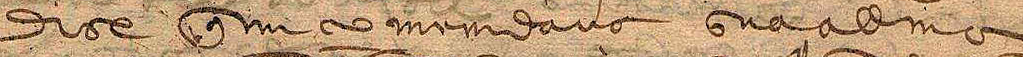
dise q̄ emcomemdaua sua allma
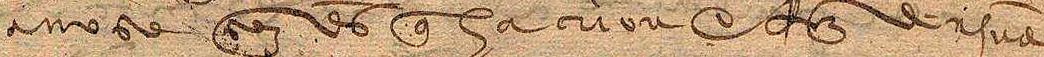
a noso s̄or d̄s q̄ ha criou e fez de nhuā
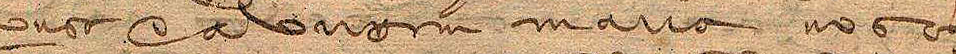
cousa e a virgem maria nosa
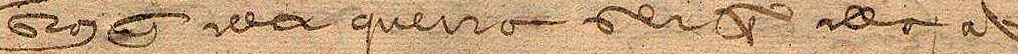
srā q̄ ella queira ser p̄o ell avo
